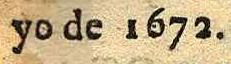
yo de 1672.
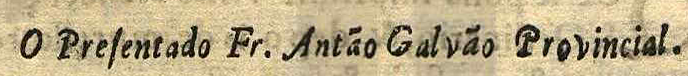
O Presentado Fr. Antão Galvão Provincial.
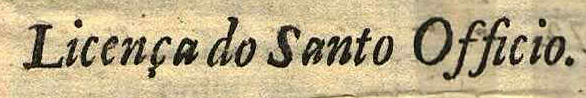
Licença do Santo Officio.
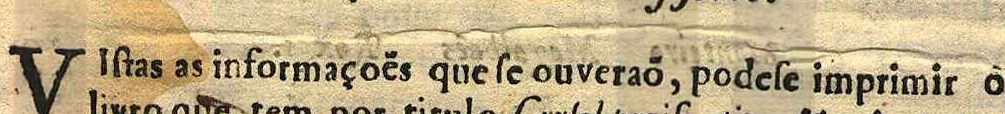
VIstas as informaçoẽs que se ouveraõ, podese imprimir o
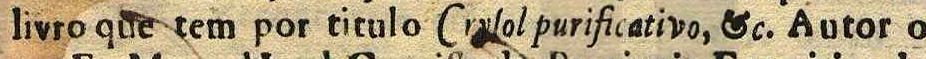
livro que tem por titulo Crysol purificativo, &c. Autor o
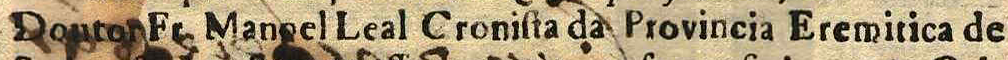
Doutor Fr Manoel Leal Cronista da Provincia Eremitica de
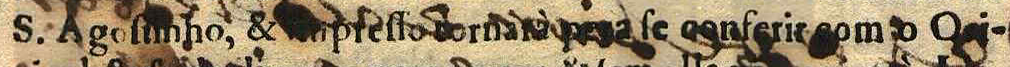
S. Agostinho, & impresso tornara pera se a conferir com o Ori
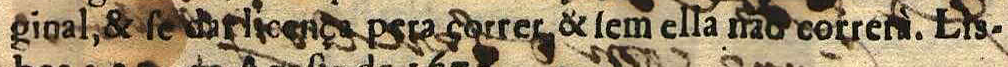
ginal, & se dar licença pera correr & sem ella não correrà. Lis
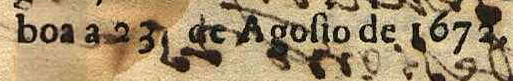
boa a 23 de Agosto de 1672.
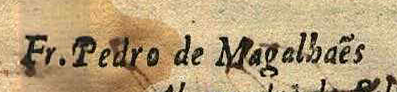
Fr. Pedro de Magalhaẽs
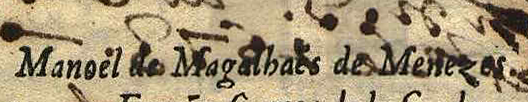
Manoel de Magalhaẽs de Menezes.
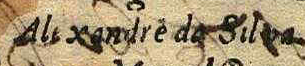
Alexandre da Silva
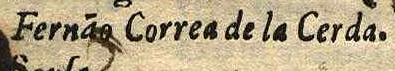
Fernão Correa de laCerda.
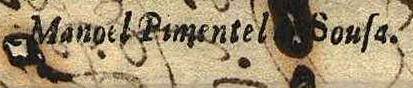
Manoel Pimentel _ Sousa.
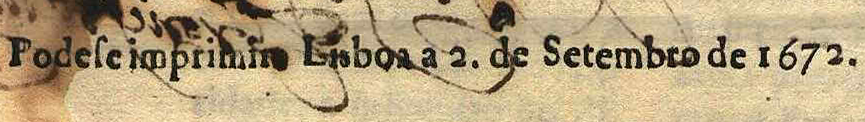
Podese imprimir Lisboa a 2. de Setembro de 1672.
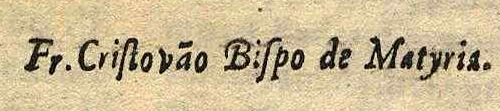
Fr. Cristovão Bispo de Matyria.
